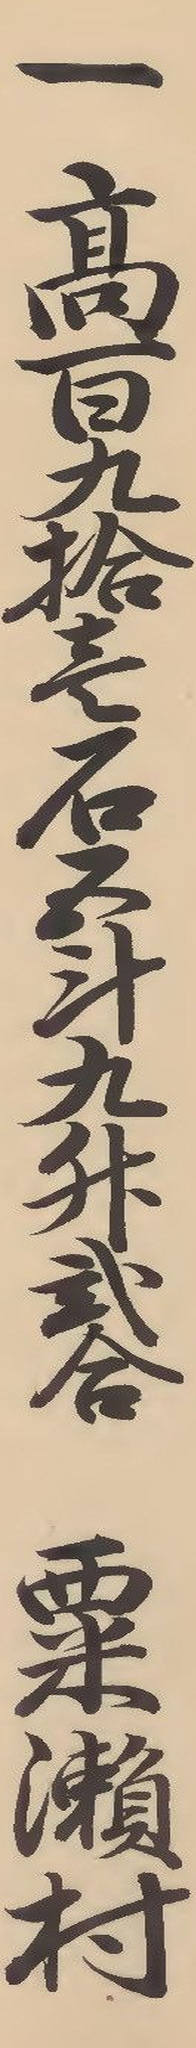一高百九拾壱石五斗九升弐合粟瀬村
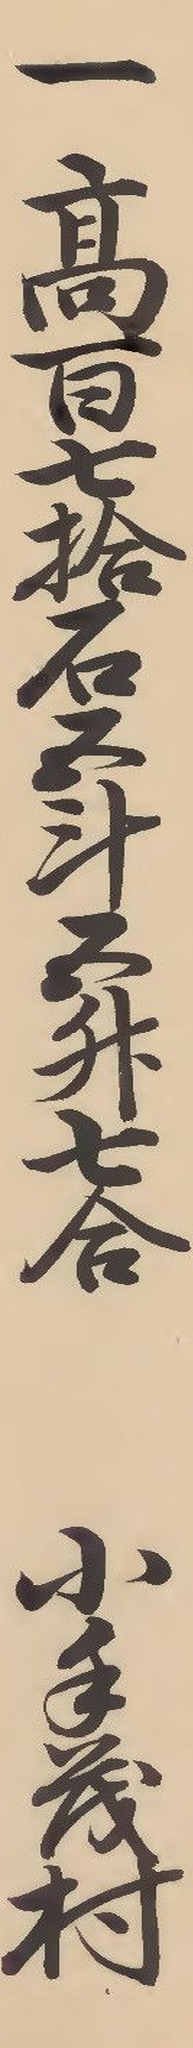一高百七拾石五斗五升七合小手茂村
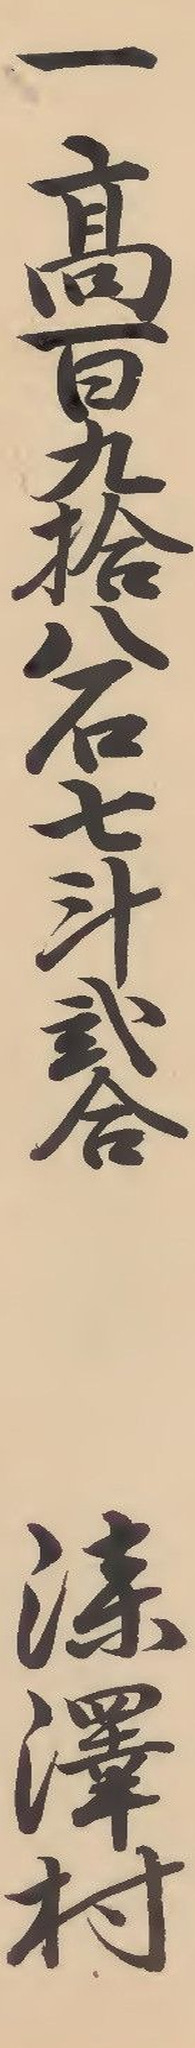一高百九拾八石七斗弐合漆沢村

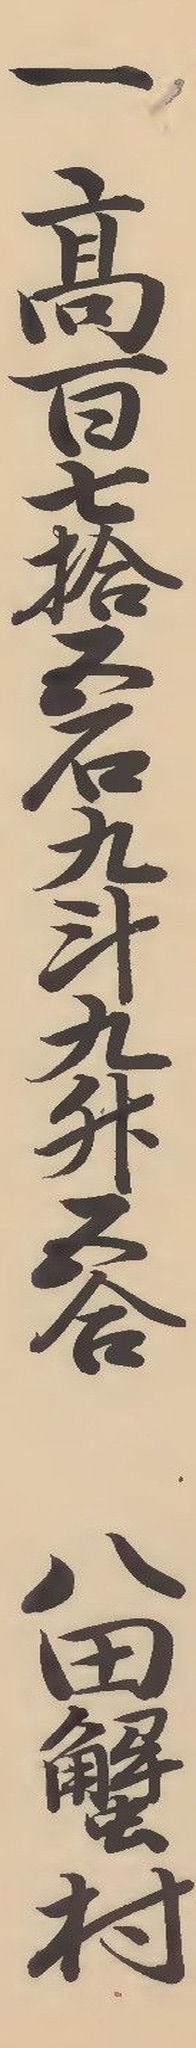一高百七拾五石九斗九升五合八田蟹村
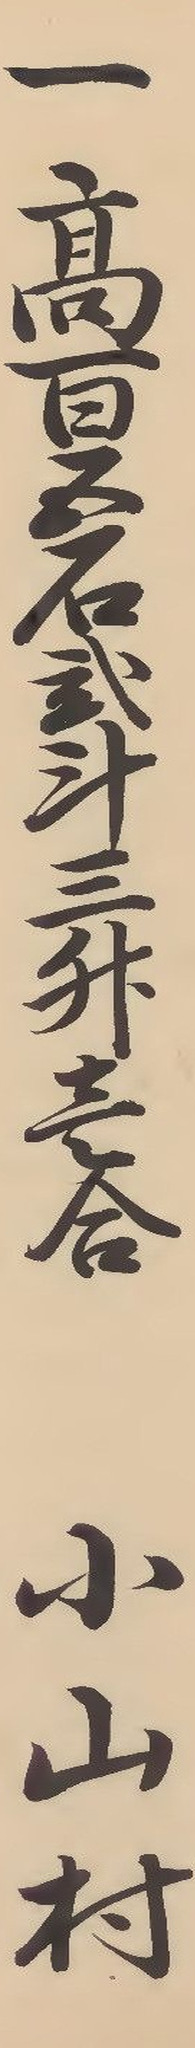一高百五石弐斗三升壱合小山村
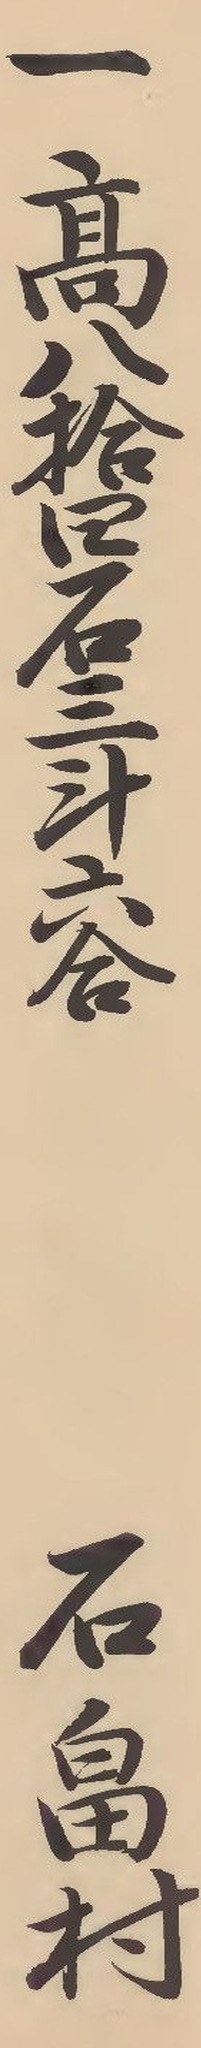一高八拾四石三斗六合石畠村
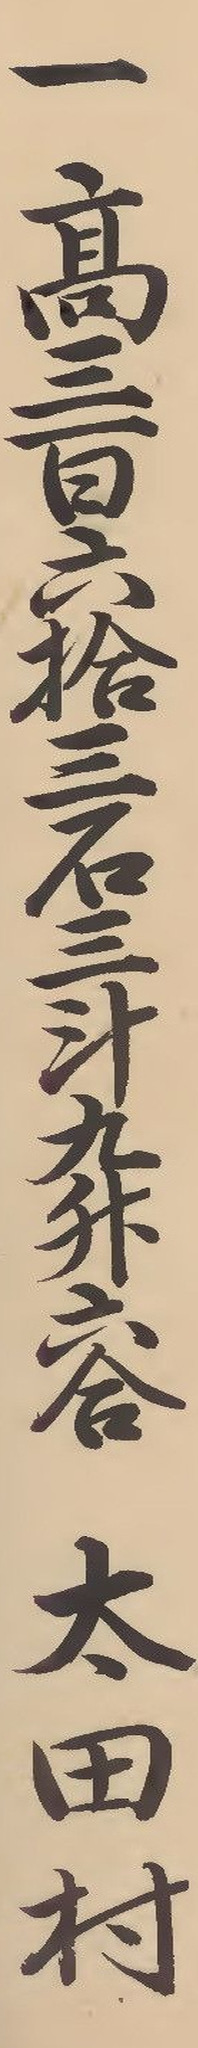一高三百六拾三石三斗九升六合太田村
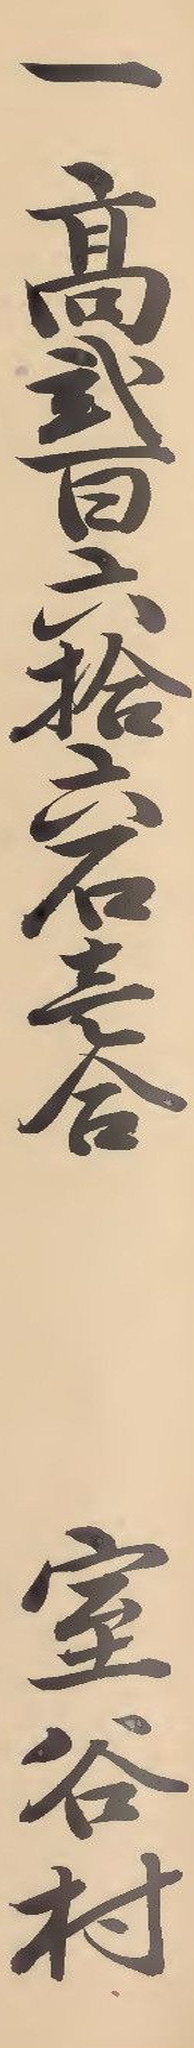一高弐百六拾六石壱合室谷村
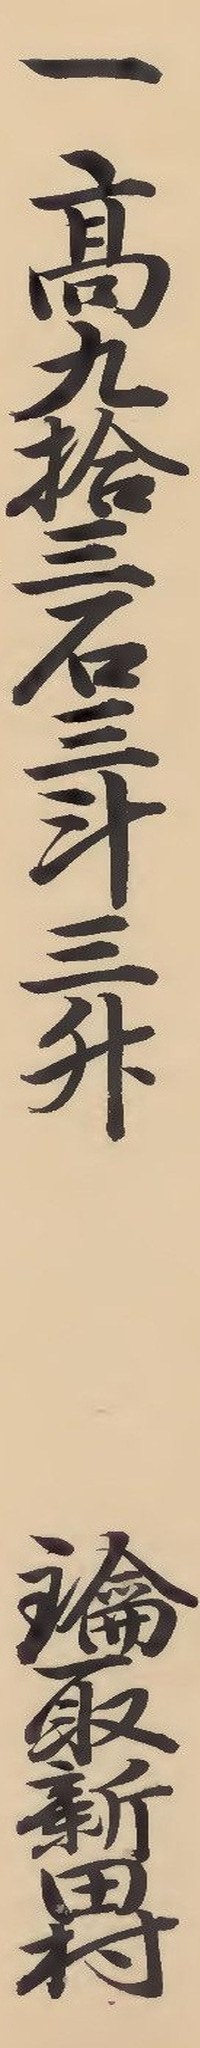一高九拾三石三斗三升鑰取新田村
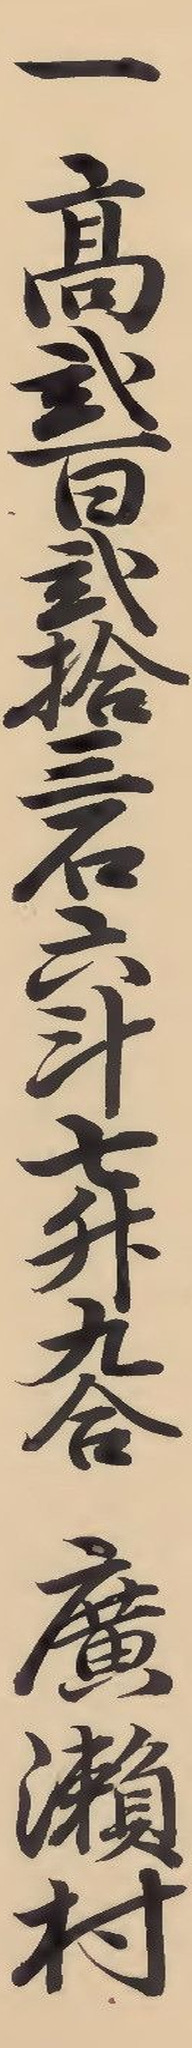一高弐百弐拾三石六斗七升九合広瀬村
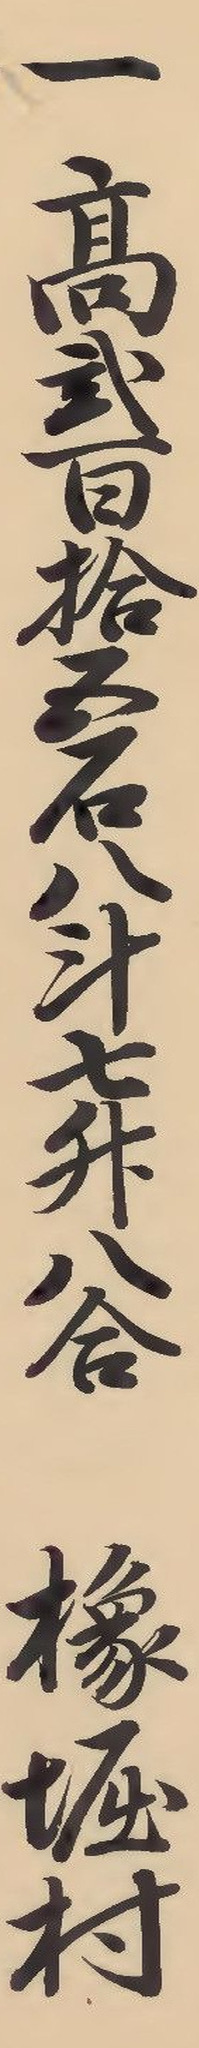一高弐百拾五石八斗七升八合橡堀村

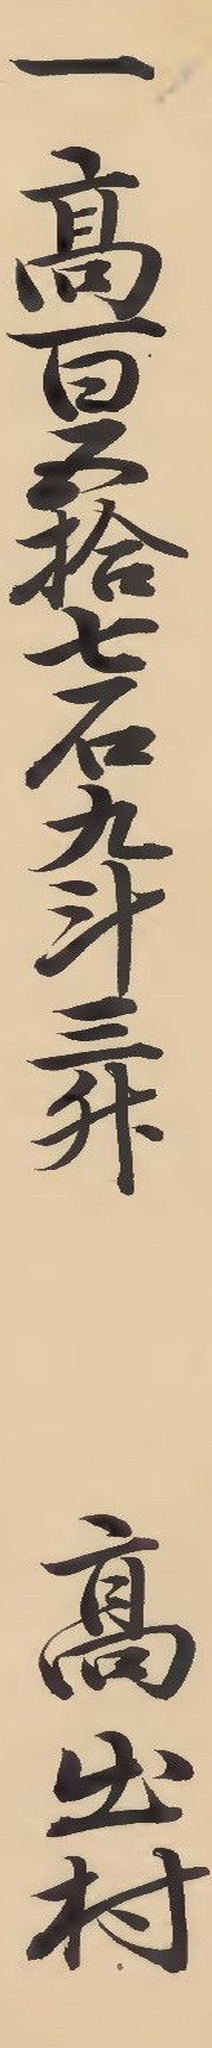一高百五拾七石九斗三升高出村
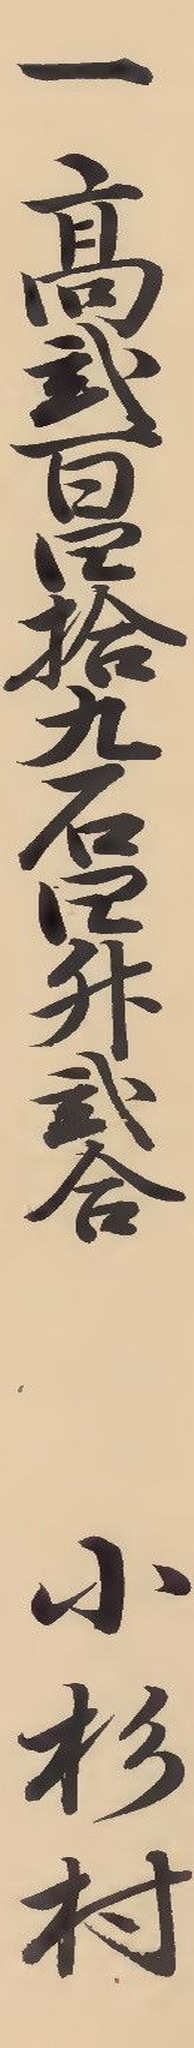一高弐百四拾九石四升弐合小杉村
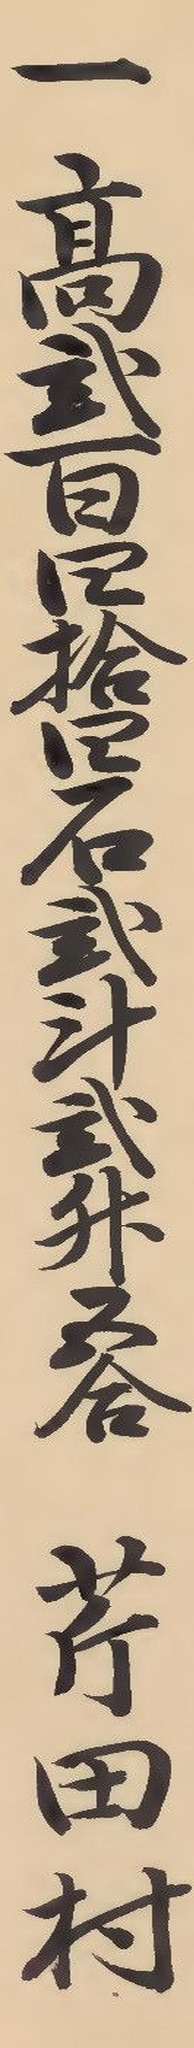一高弐百四拾四石弐斗弐升五合芹田村
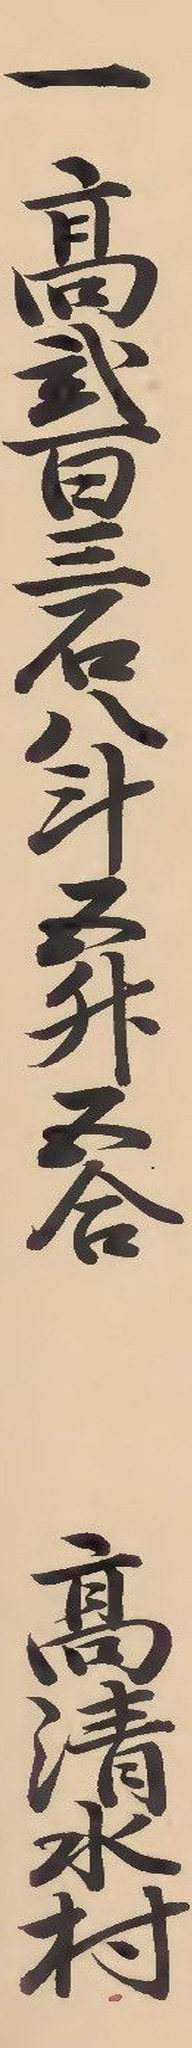一高弐百三石八斗五升五合高清水村
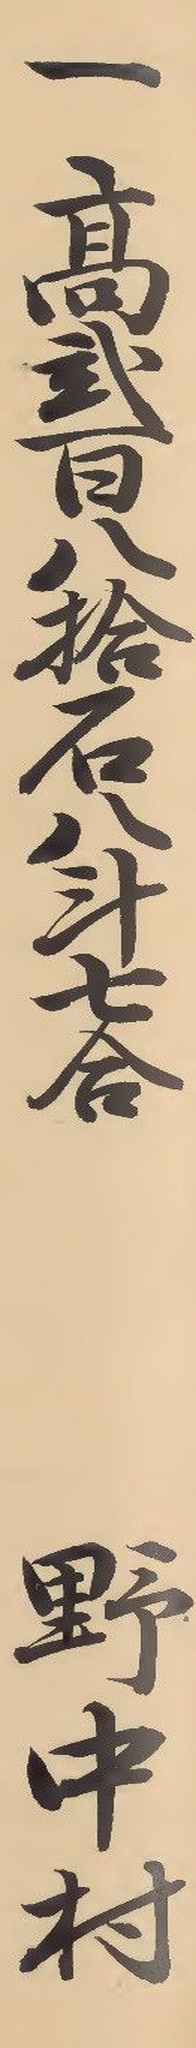一高弐百八拾石八斗七合野中村
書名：越後国郷帳　下
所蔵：国立公文書館 National Archives of Japan
